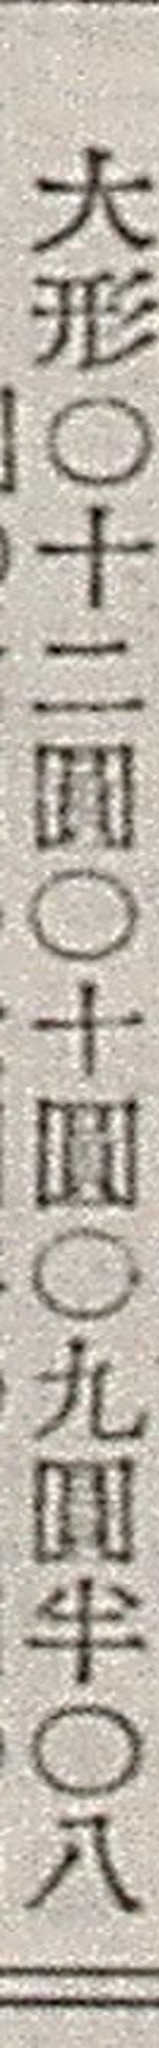大形○十二円○十円○九円半○八
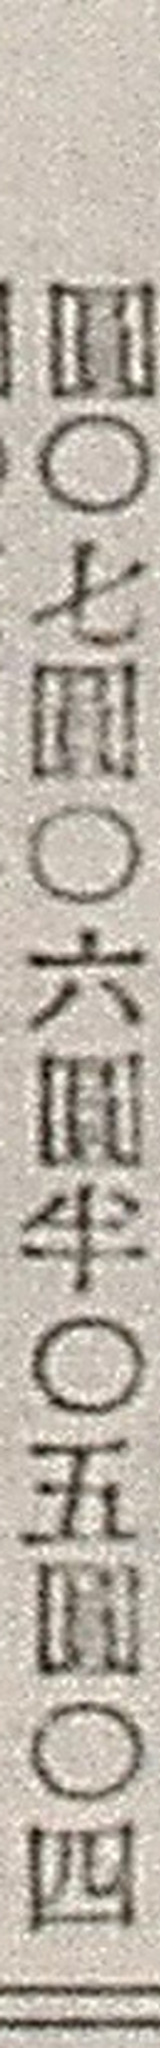円○七円○六円半○五円○四
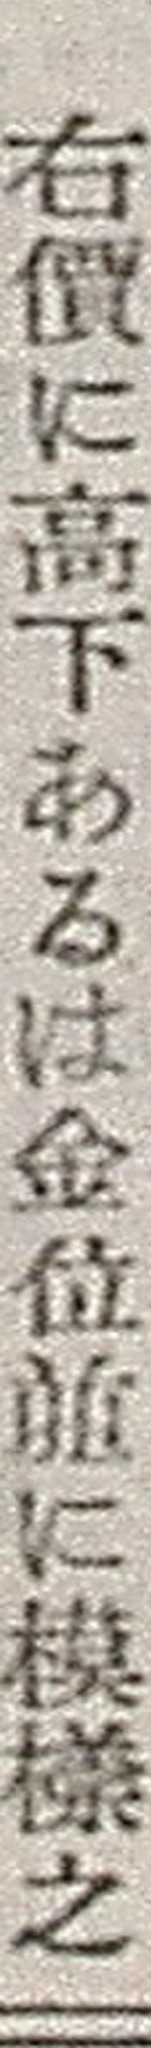右価に高下あるは金位並に模様之
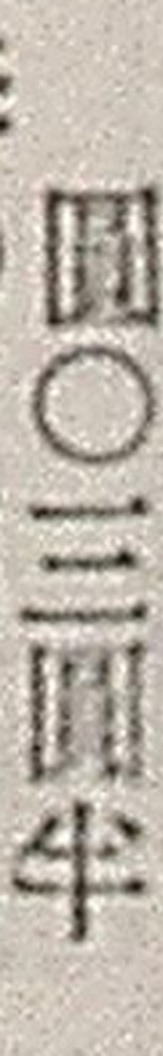円○三円半
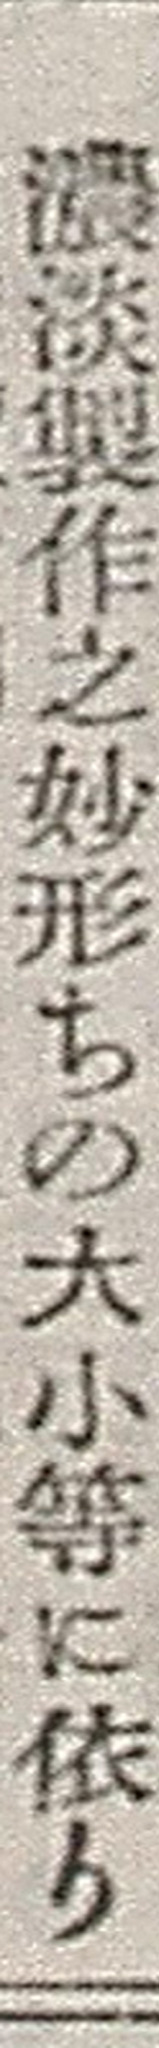濃淡製作之妙形ちの大小等に依り
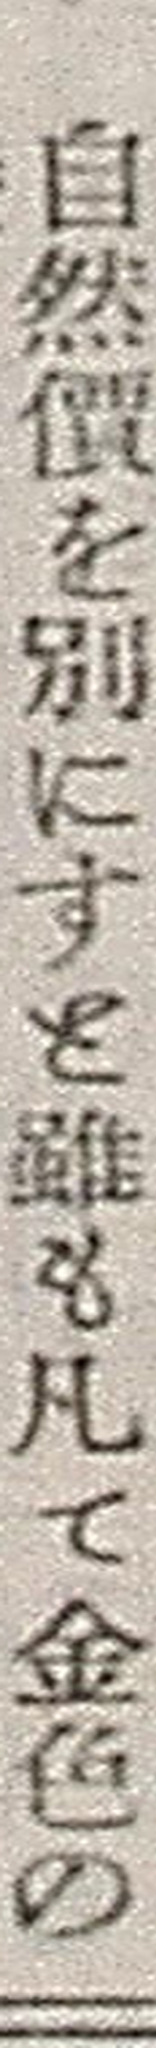自然価を別にすと雖も凡て金色の
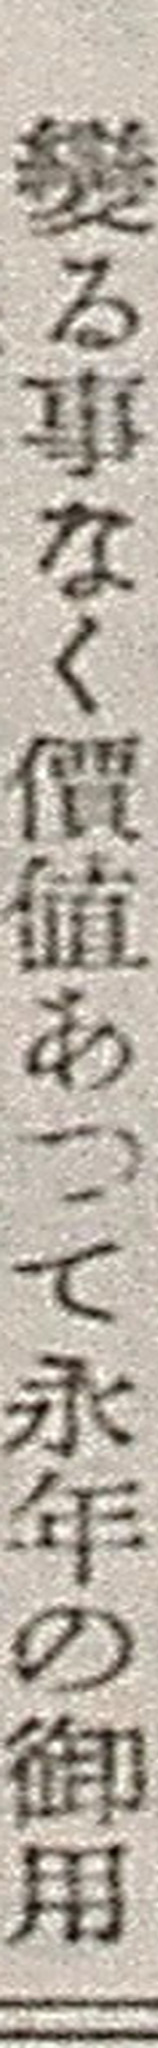変る事なく価値あつて永年の御用
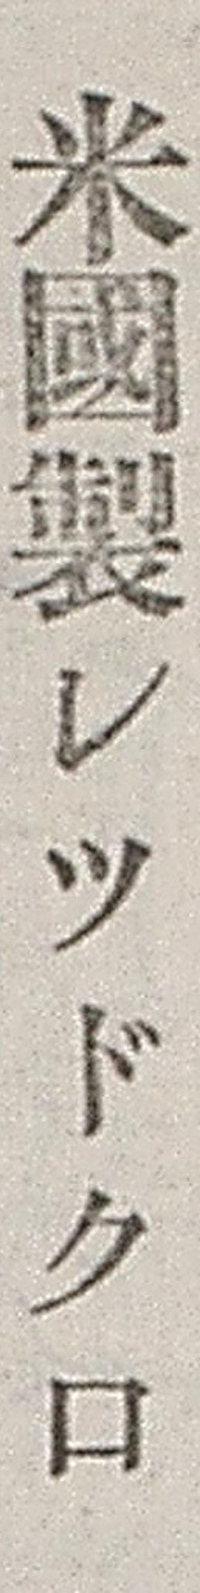米国製レッドクロ
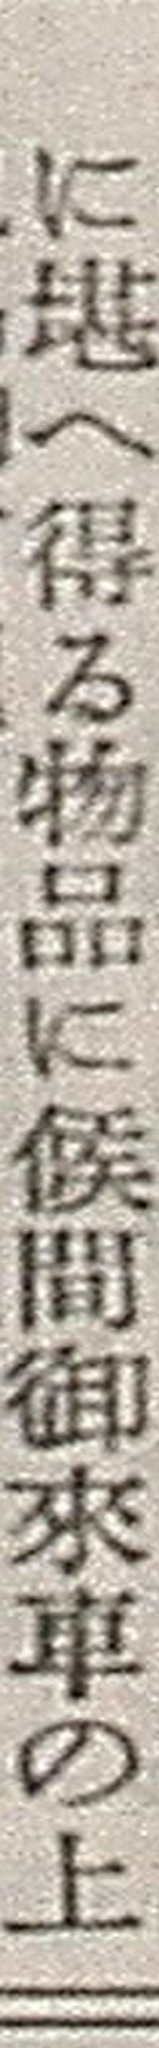に堪へ得る物品に候間御来車の上
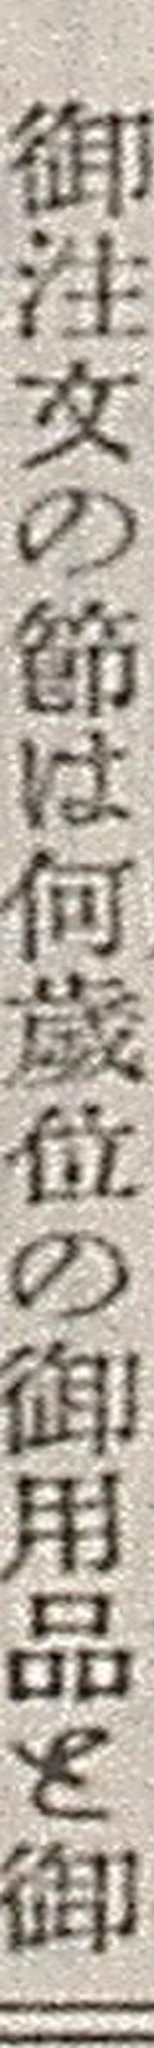御注文の節は何歳位の御用品を御
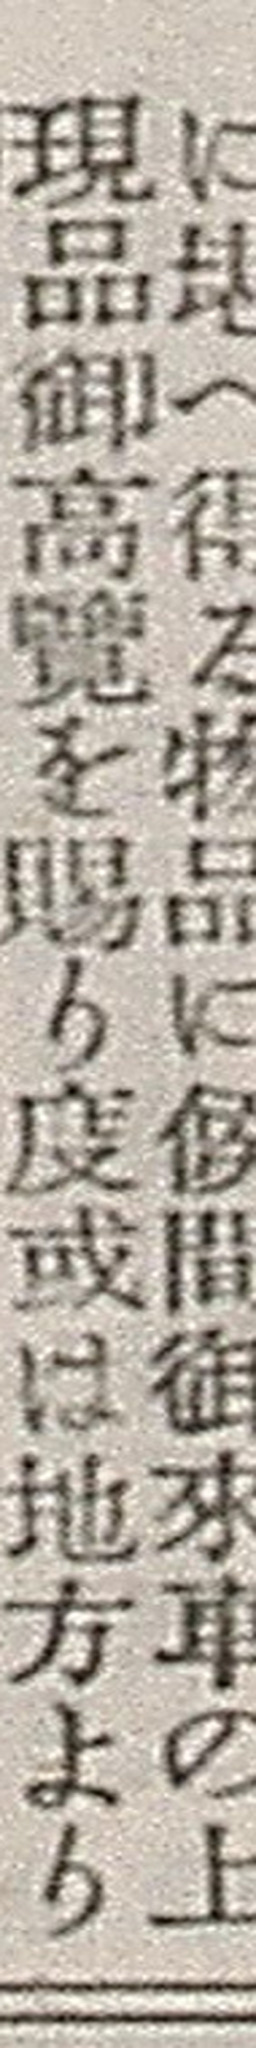現品御高覧を賜り度或は地方より
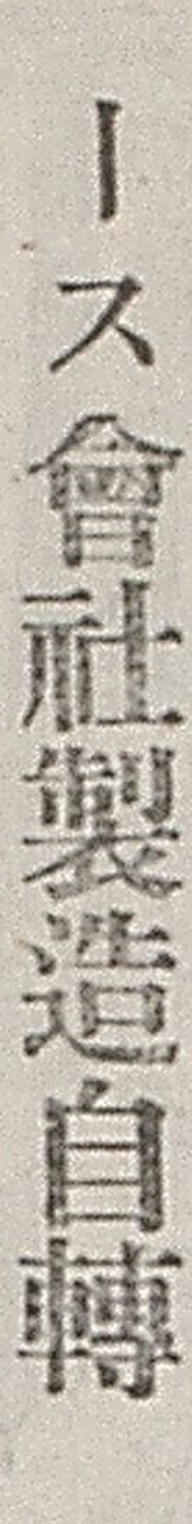ース会社製造自転
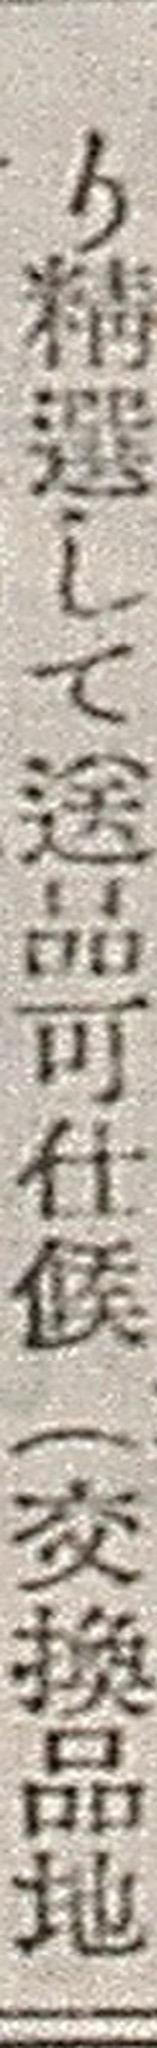り精選して送品可仕候（交換品地
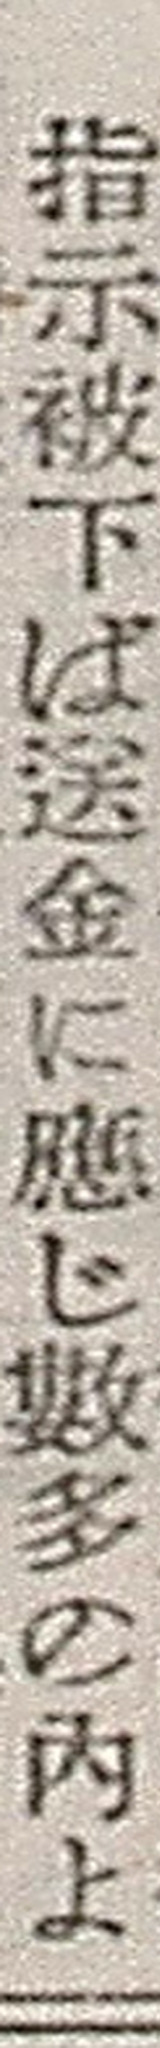指示被下ば送金に応じ数多の内よ
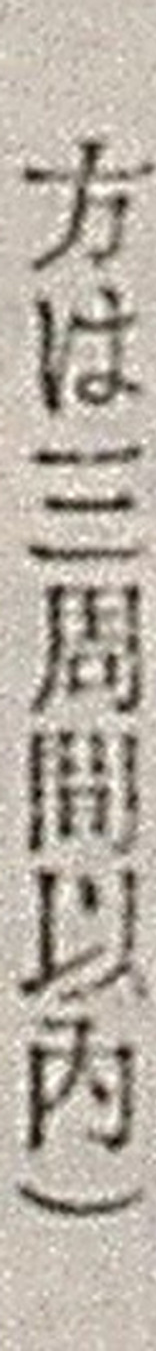方は三周間以内）
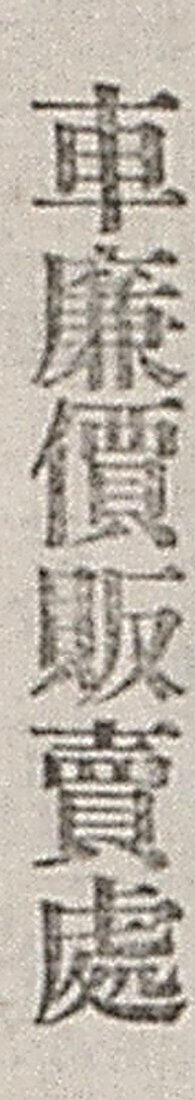車廉価販売処
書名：風俗畫報臨時増刊第百九十九號　明治三十二年十月各地災害圖會（前編之續）
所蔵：東京大学地震研究所図書室 Earthquake Research Institute Library, The University of Tokyo, JAPAN
